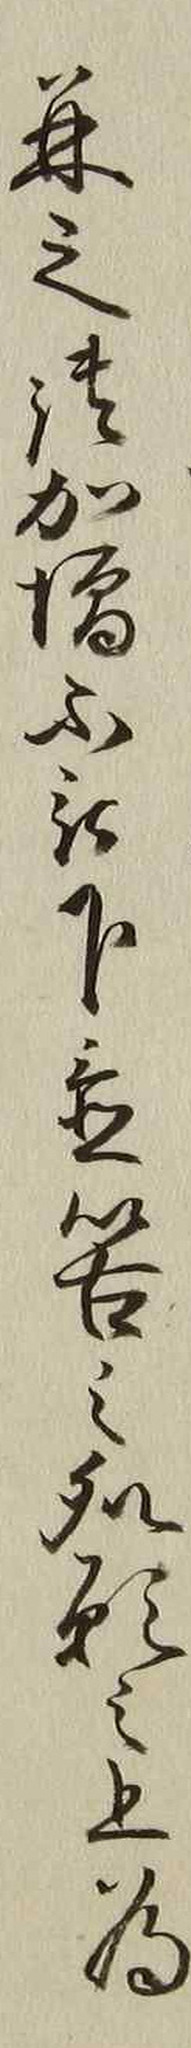再之御加増不被下置筈之処願之上為
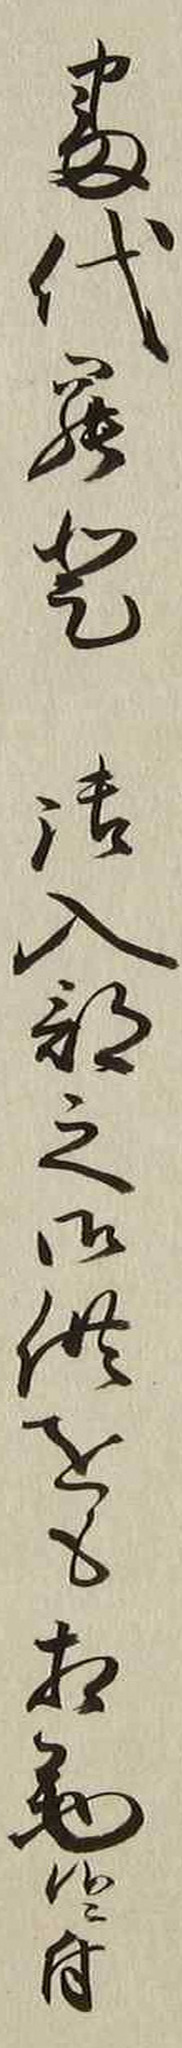番代罷登御入部之御供をも相勤候ニ付
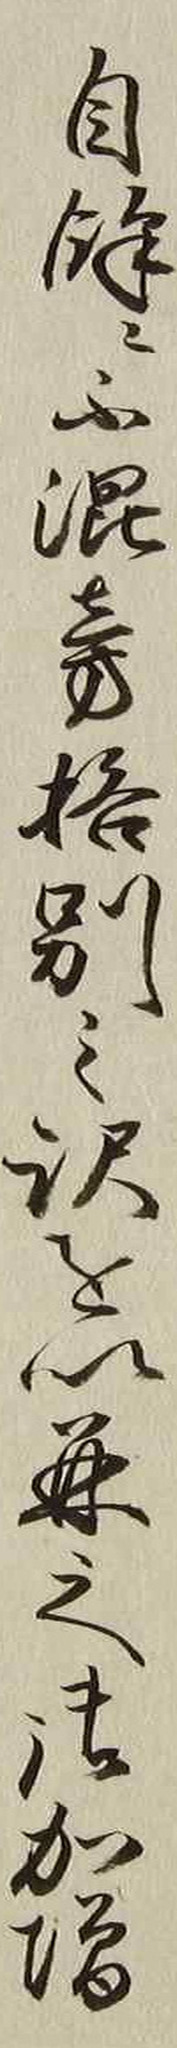自余ニ不混旁格別之訳を以再之御加増
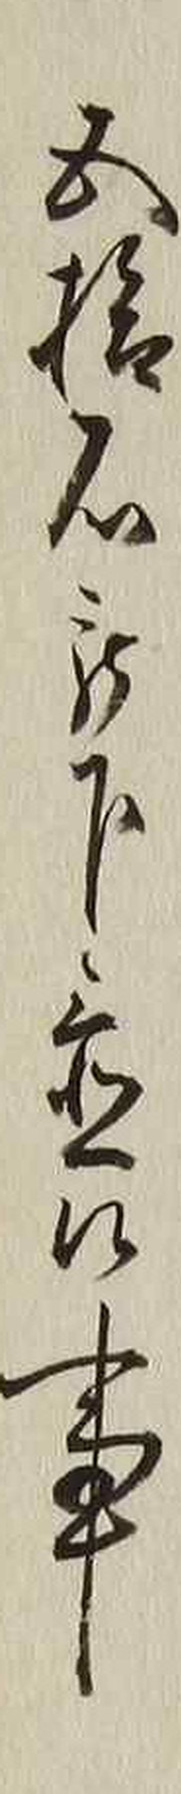五拾石被下置候事
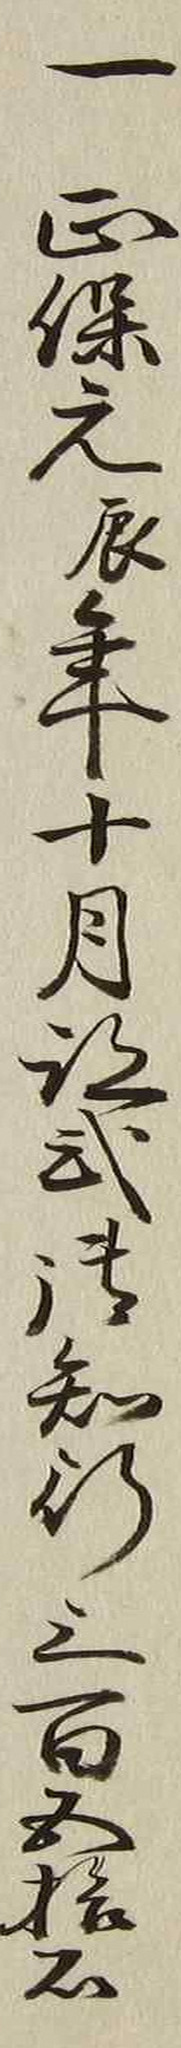一正保元辰年十月跡式御知行三百五拾石
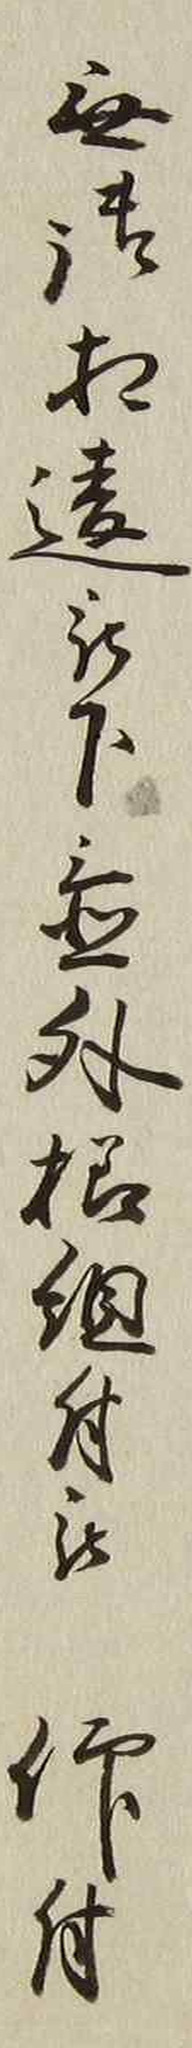無御相違被下置外様組付被仰付
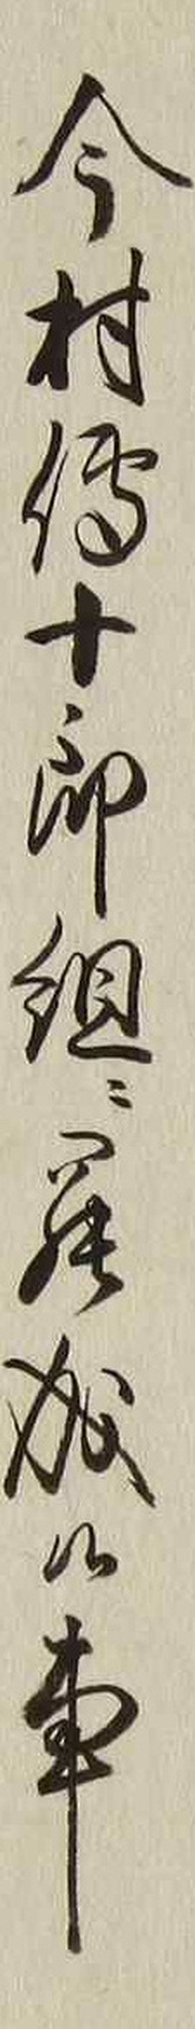今村伝十郎組ニ罷成候事
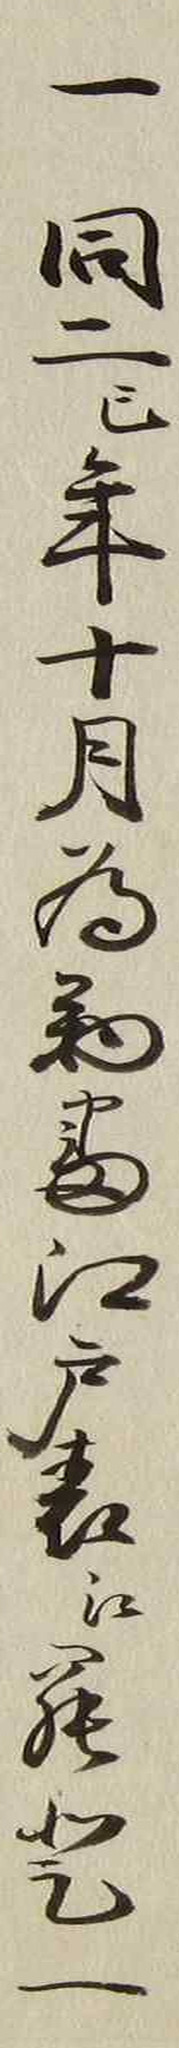一同二巳年十月為勤番江戸表江罷登一
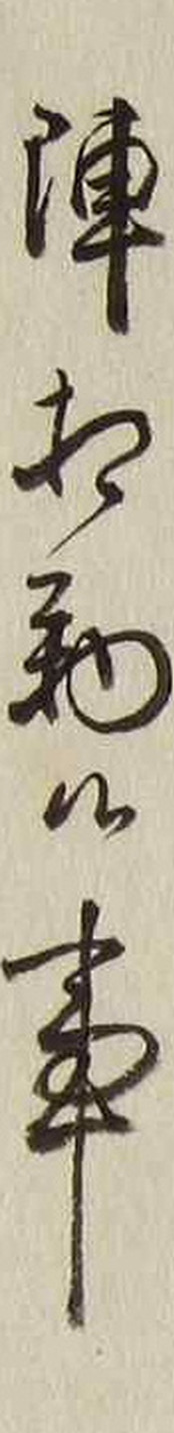陣相勤候事
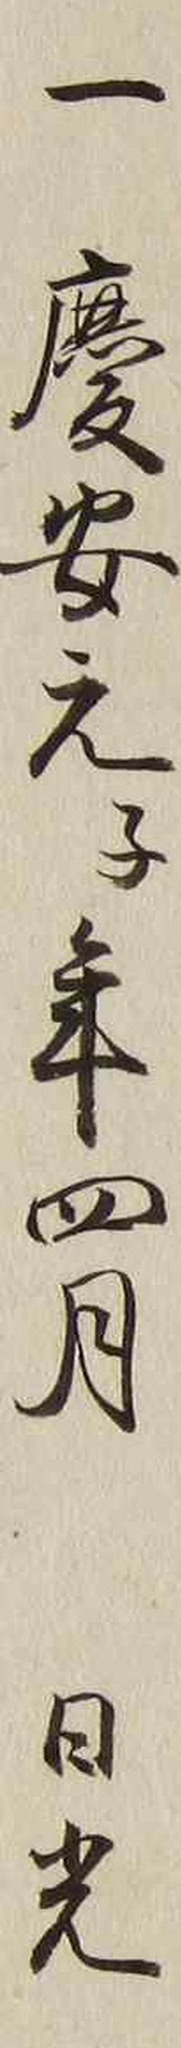一慶安元子年四月日光
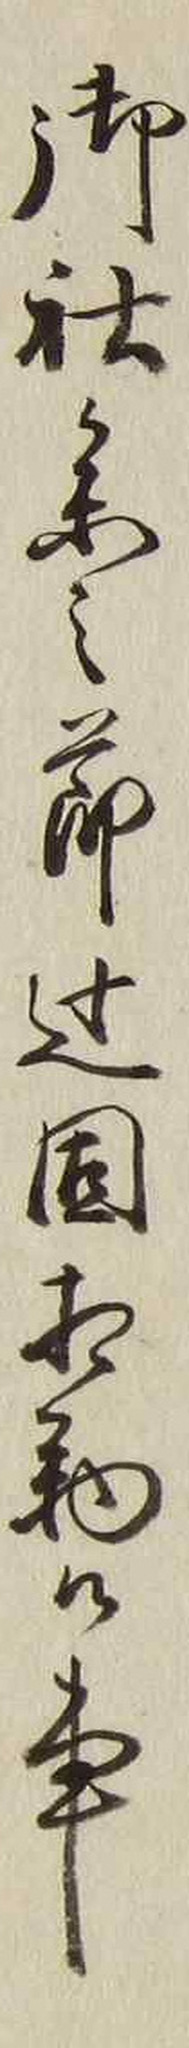御社参之節辻固相勤候事

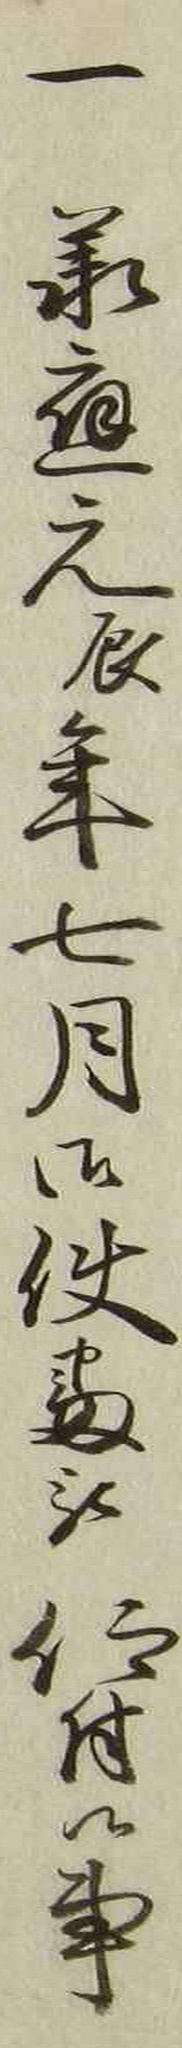一承応元辰年七月御使番被仰付候事
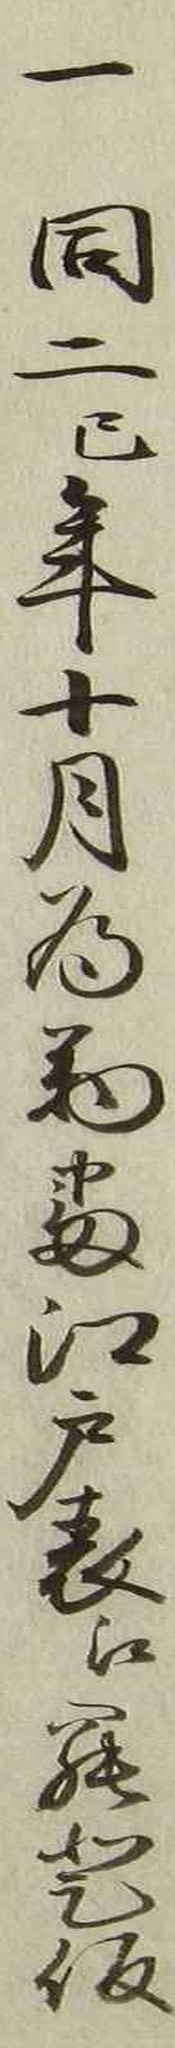一同二巳年十月為勤番江戸表江罷登仮
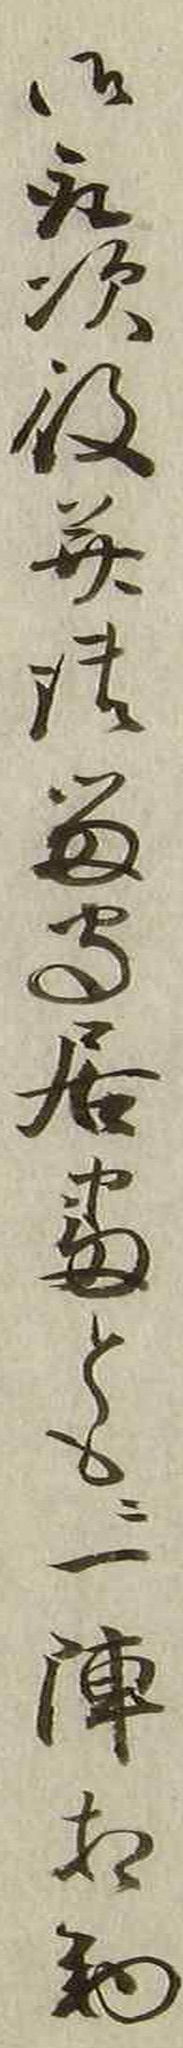御取次役并御留守居番ともニ一陣相勤
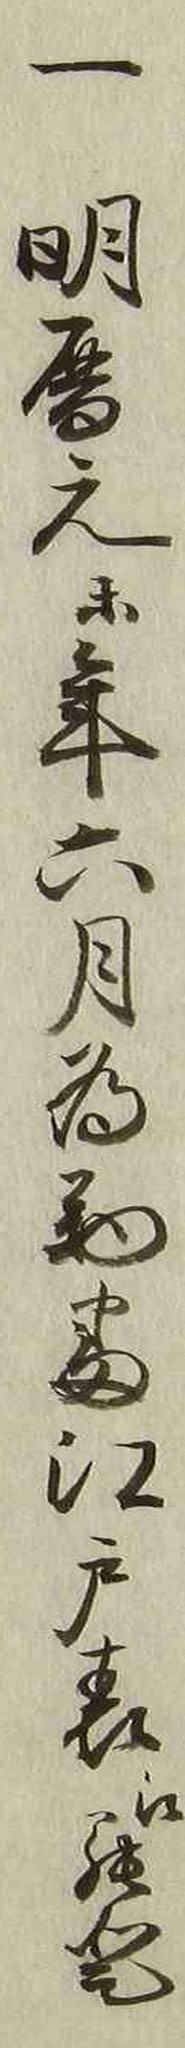一明暦元未年六月為勤番江戸表江罷登
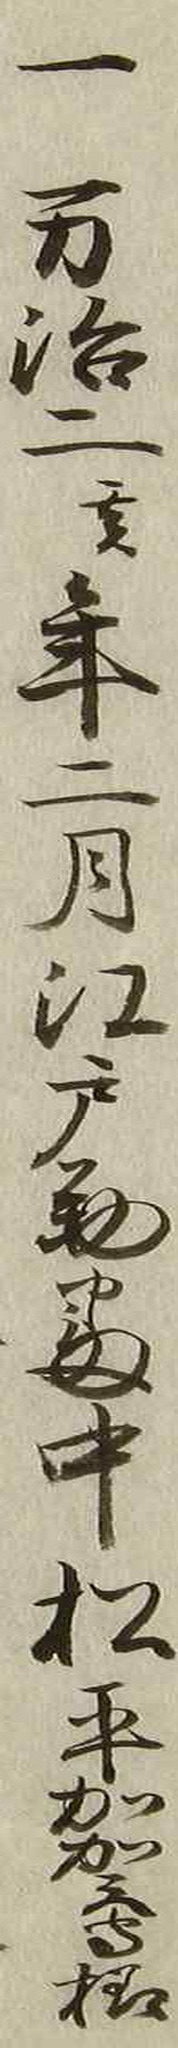一万治二亥年二月江戸勤番中松平加賀守様
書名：諸士系譜　巻之15　い之部15
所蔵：会津若松市立会津図書館
